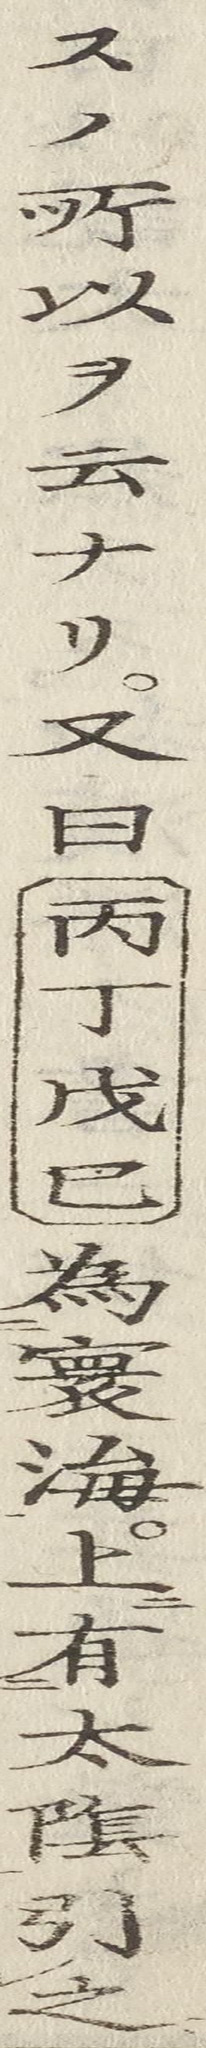スノ所以ヲ云ナリ。又曰丙丁戊巳為ニ寰海。上有ニ太陰引之。
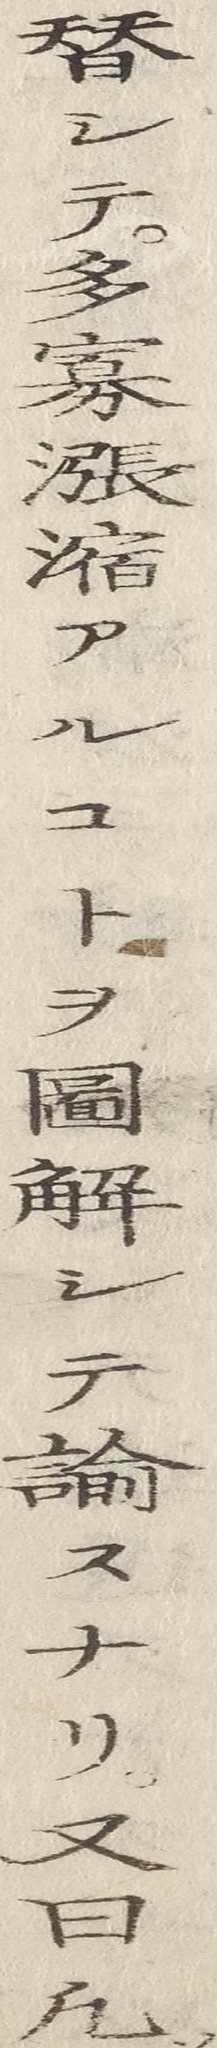替シテ。多寡漲㴼アルコトヲ図解シテ論スナリ。又曰凡
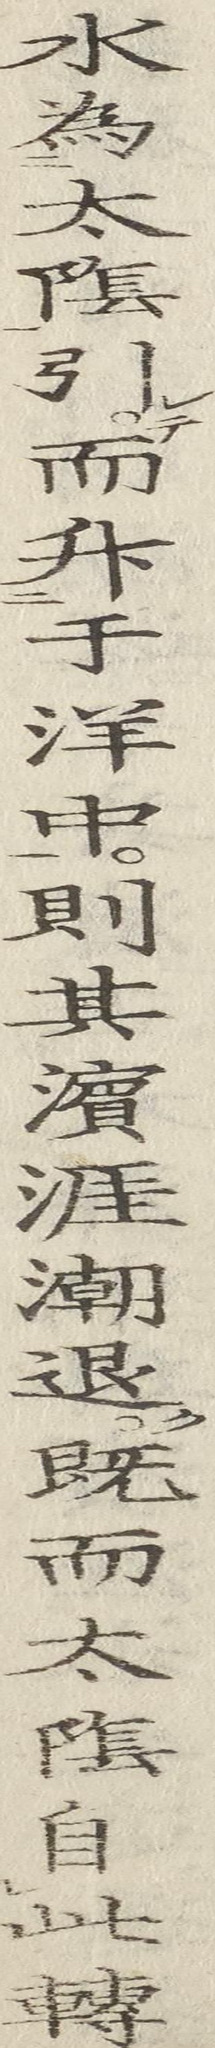水為ニ太陰引。而升ニ干洋中。則其浜涯潮退。既而太陰自此転

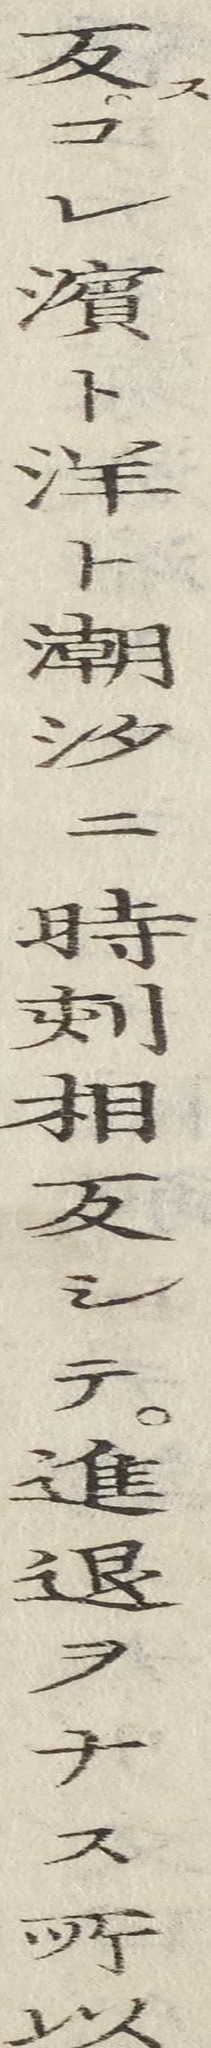反。コレ浜ト洋ト潮汐ニ時刻相反シテ。進退ヲナス所以
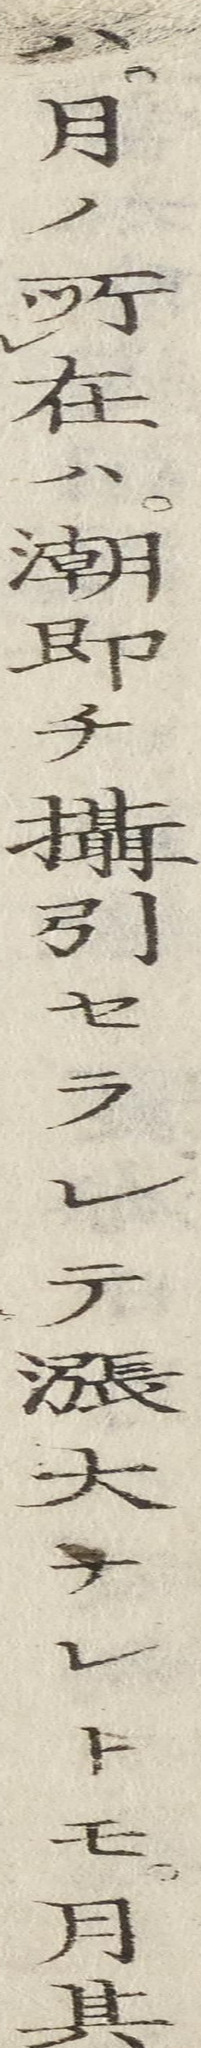ハ。月ノ所在ハ。潮即チ摂引セラレテ漲大ナレトモ。月其
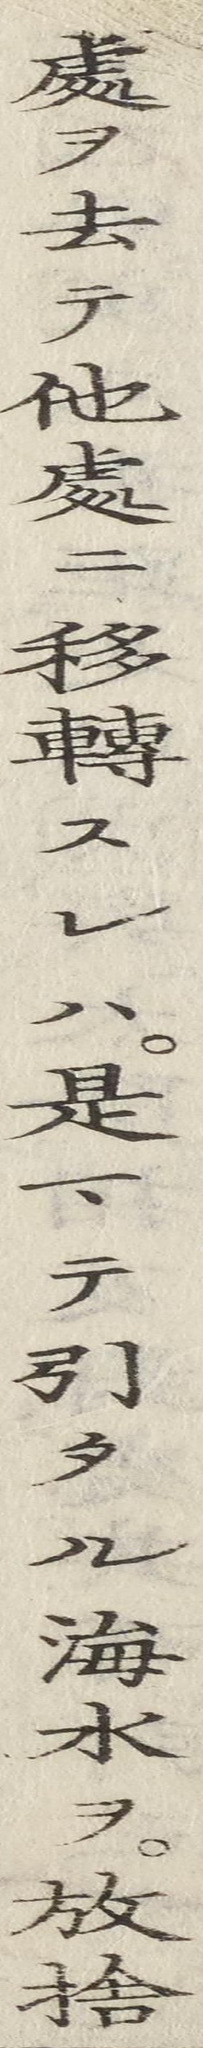処ヲ去テ他処ニ移転スレハ。是マテ引タル海水ヲ。放捨
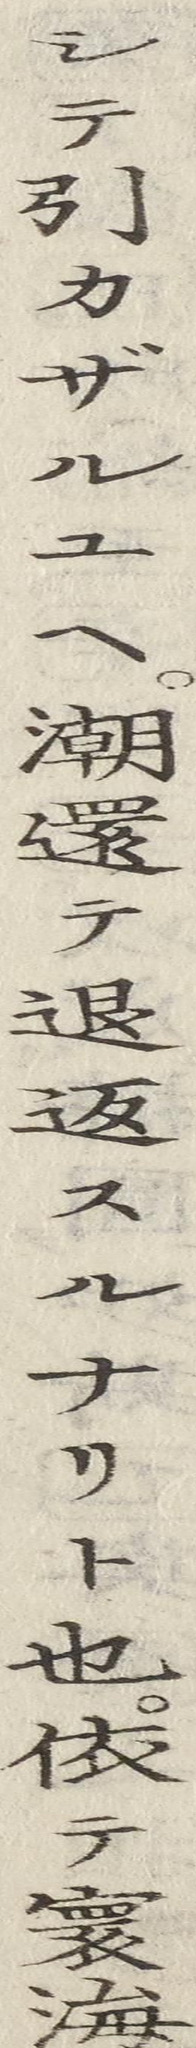シテ引力ザルユヘ。潮還テ退返スルナリト也。依テ寰海
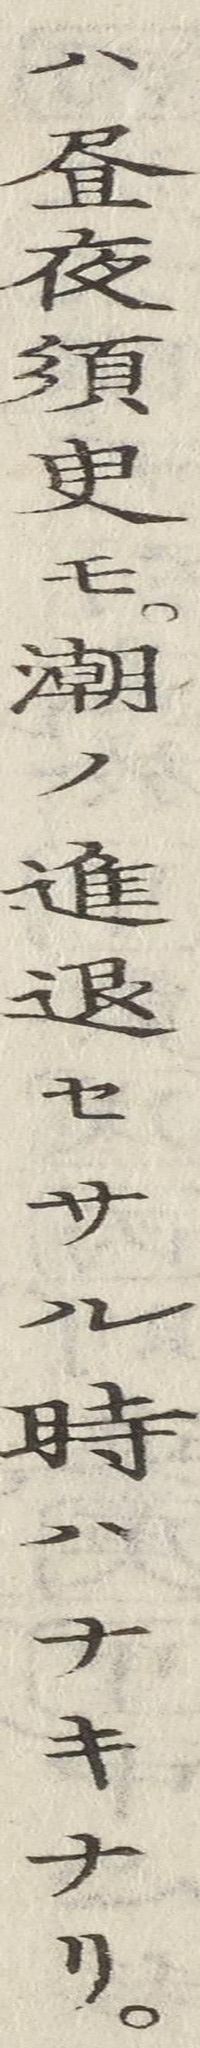ハ昼夜須臾モ。潮ノ進退セサル時ハナキナリ。
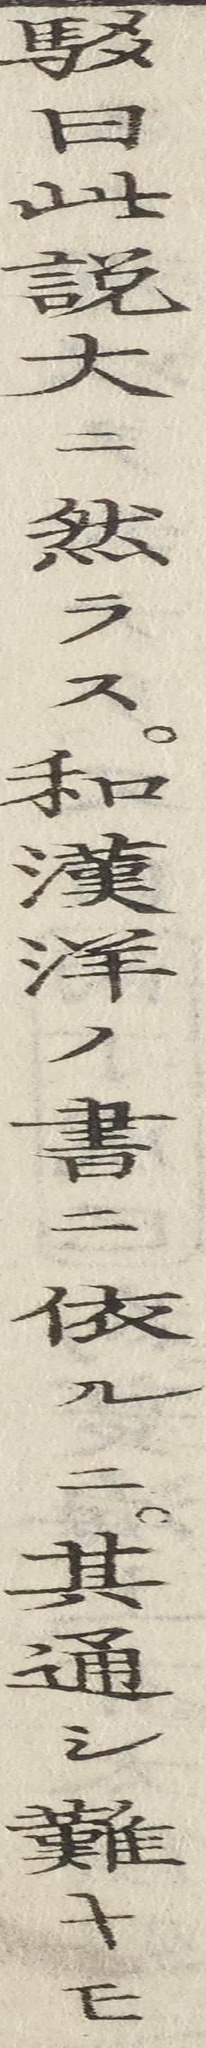駁曰此説大ニ然ラス。和漢洋ノ書ニ依ルニ。其通シ難キモ
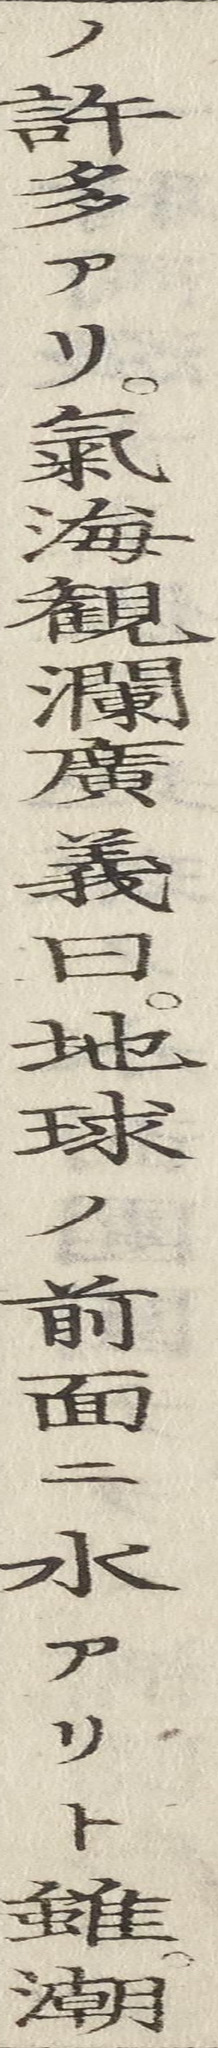ノ許多アリ。気海観瀾広義曰。地球ノ前面ニ水アリト雖。潮
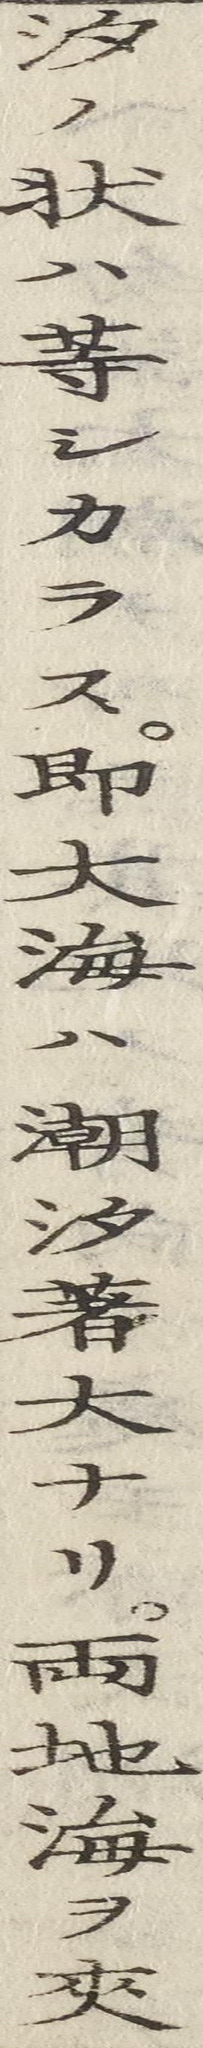汐ノ状ハ等シカラス。即大海ハ潮汐著大ナリ。両地海ヲ夾
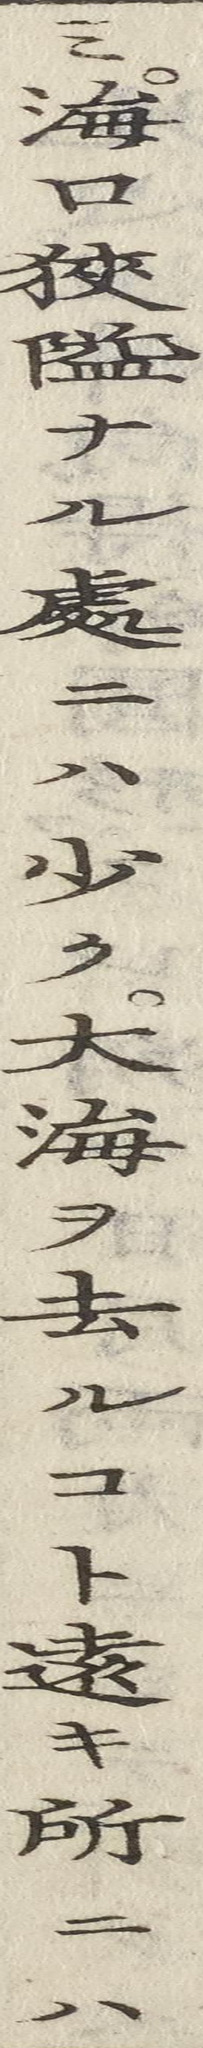ミ。海ロ狭隘ナル処ニハ少ク。大海ヲ去ルコト遠キ所ニハ
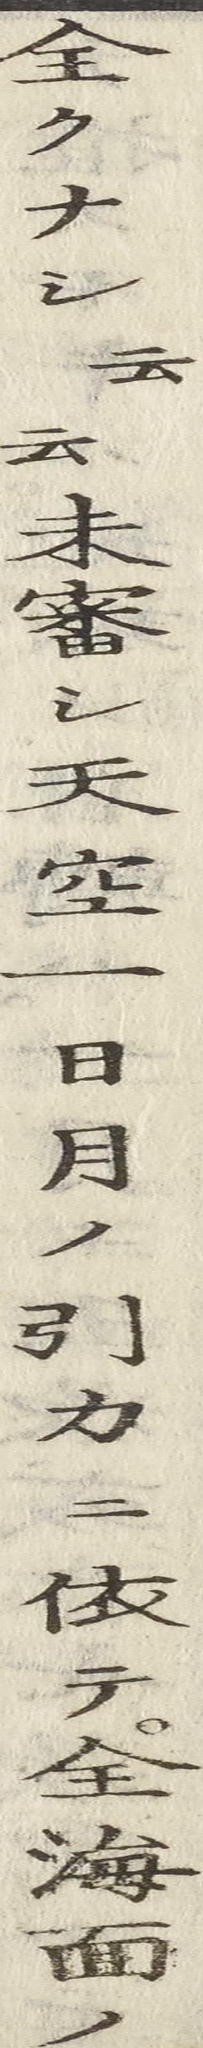全クナシ云云未審シ天空一日月ノ引力ニ依テ。全海面ノ
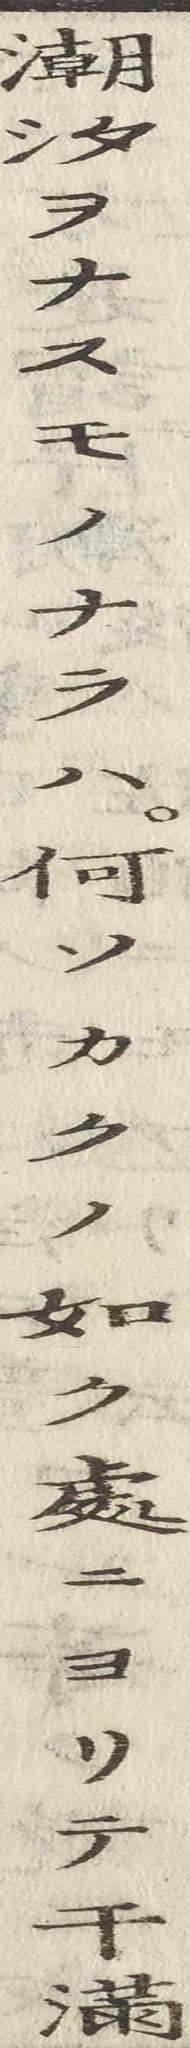潮汐ヲナスモノナラハ。何ソカクノ如ク処ニヨリテ干満
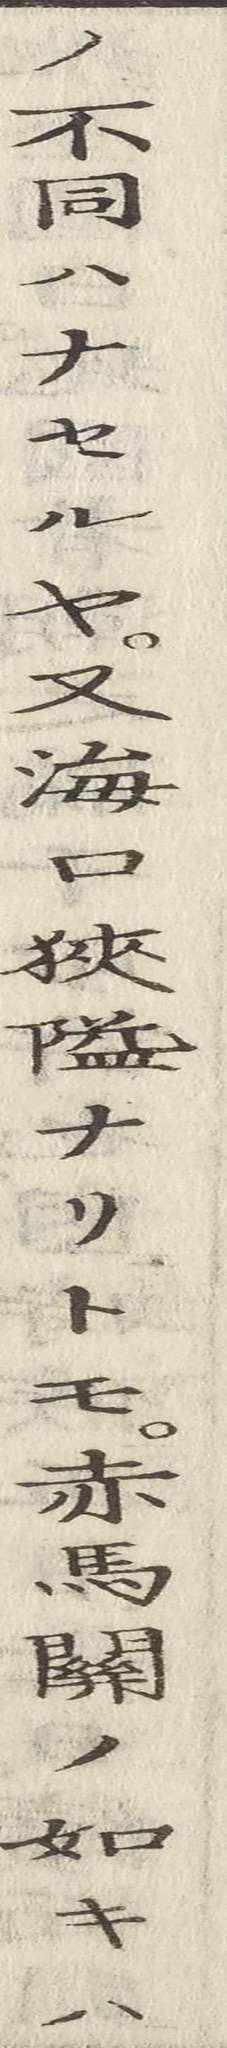ノ不同ハナセルヤ。又海ロ狭隘ナリトモ。赤馬関ノ如キハ
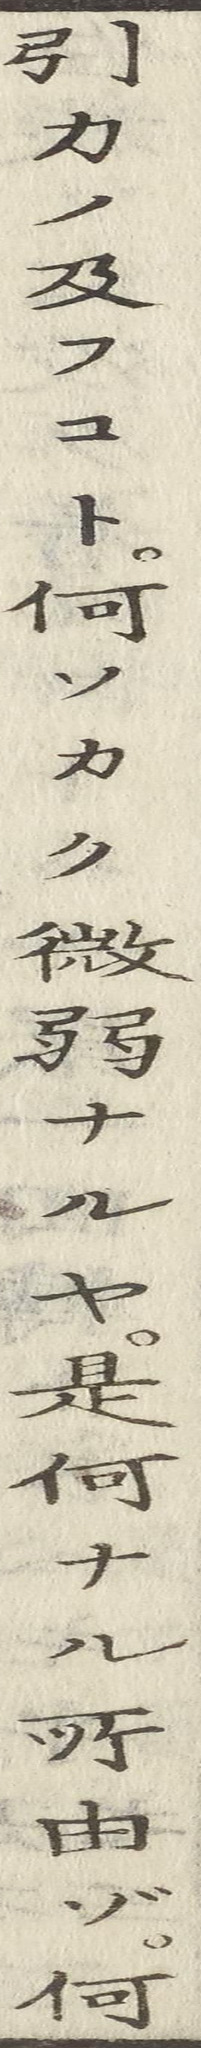引力ノ及フコト。何ソカク微弱ナルヤ。是何ナル所由ゾ。何
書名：護法新論　二編　下
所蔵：東京大学地震研究所図書室 Earthquake Research Institute Library, The University of Tokyo, JAPAN
